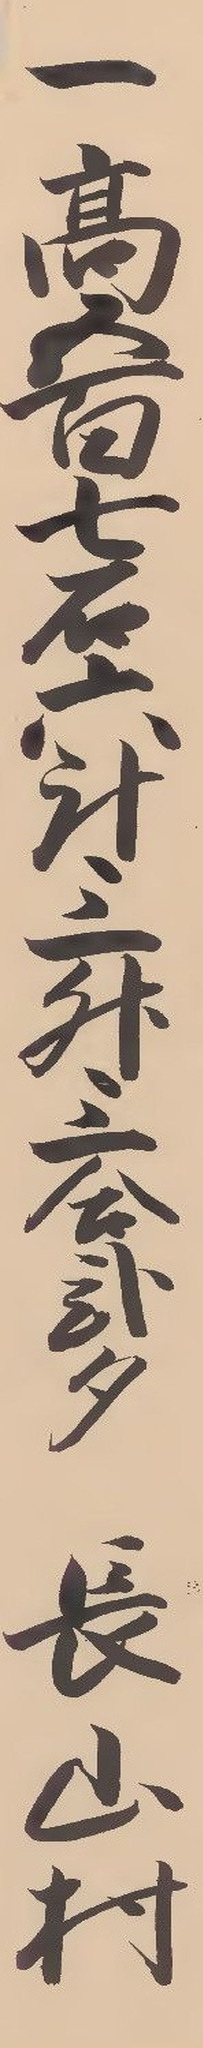一高五百七石六斗三升三合弐勺長山村
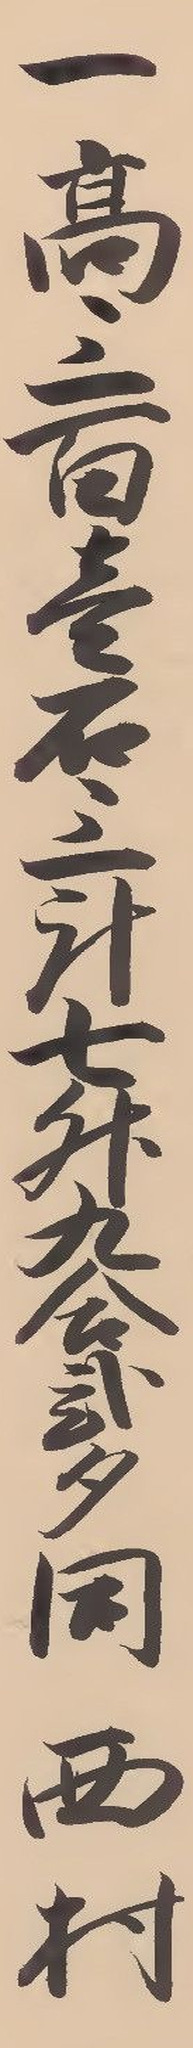一高三百壱石三斗七升九合弐勺同西村

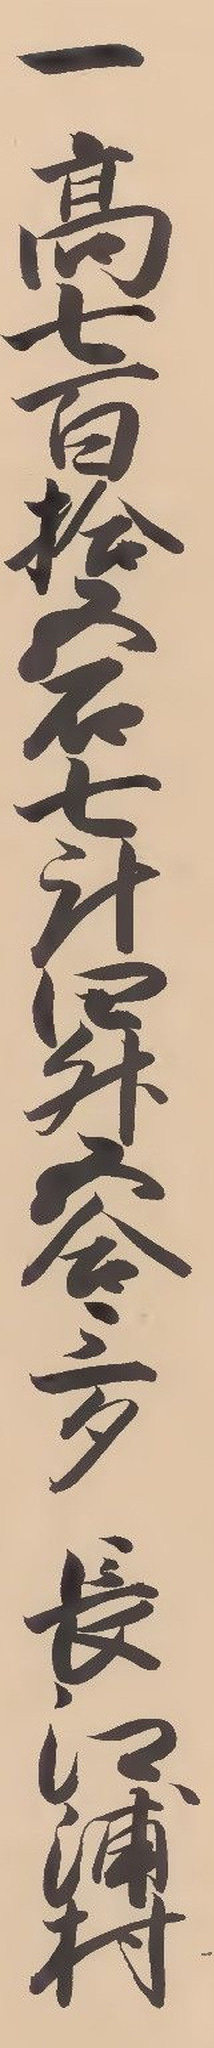一高七百拾五石七斗四升五合三勺長江浦村
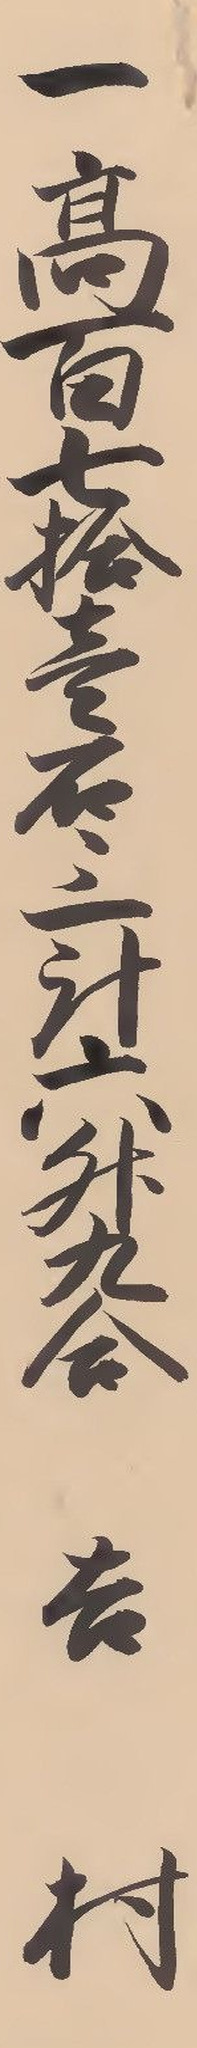一高百七拾壱石三斗六升九合吉村
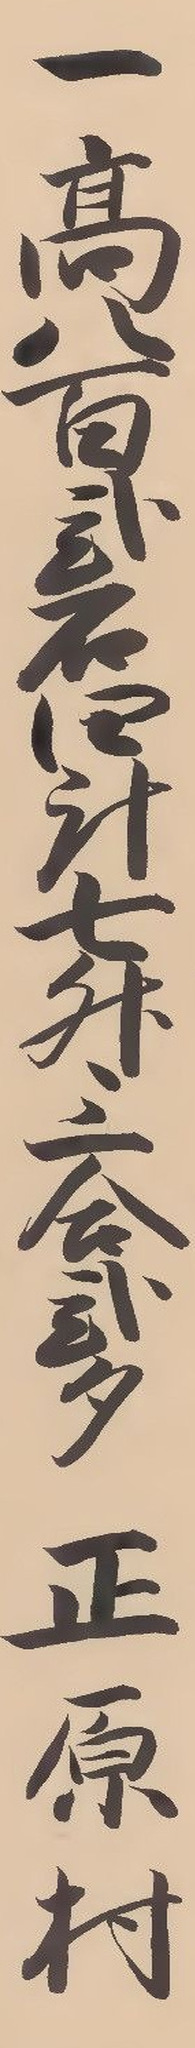一高八百弐石四斗七升三合弐勺正原村
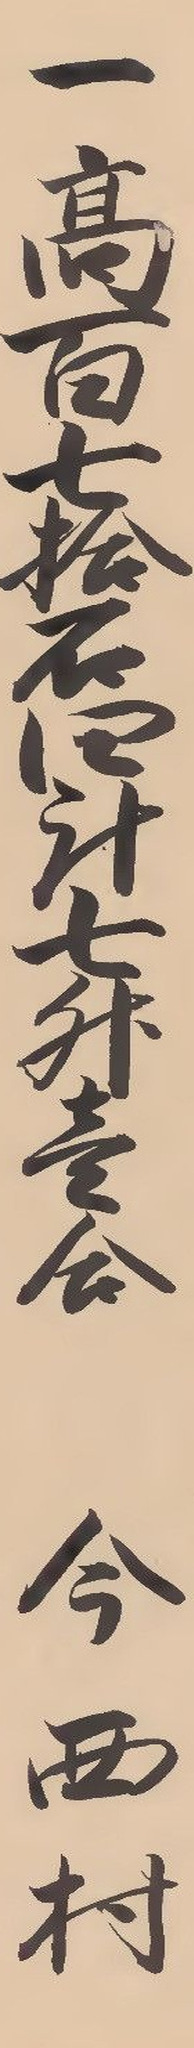一高百七拾石四斗七升壱合今西村
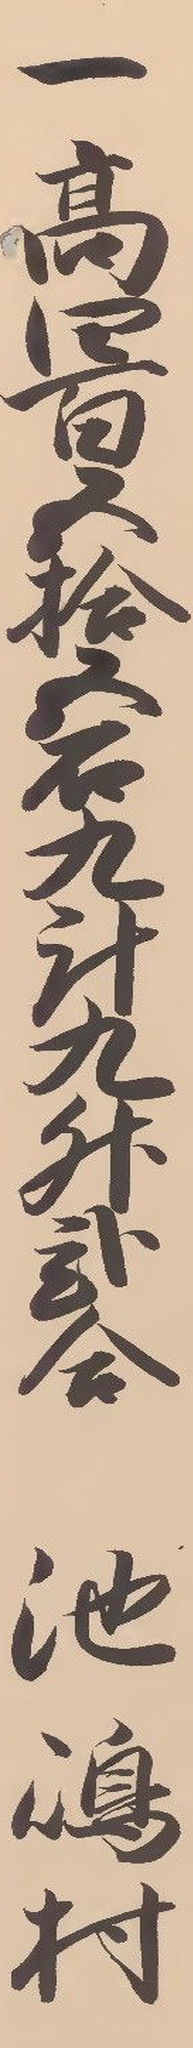一高四百五拾五石九斗九升弐合池島村
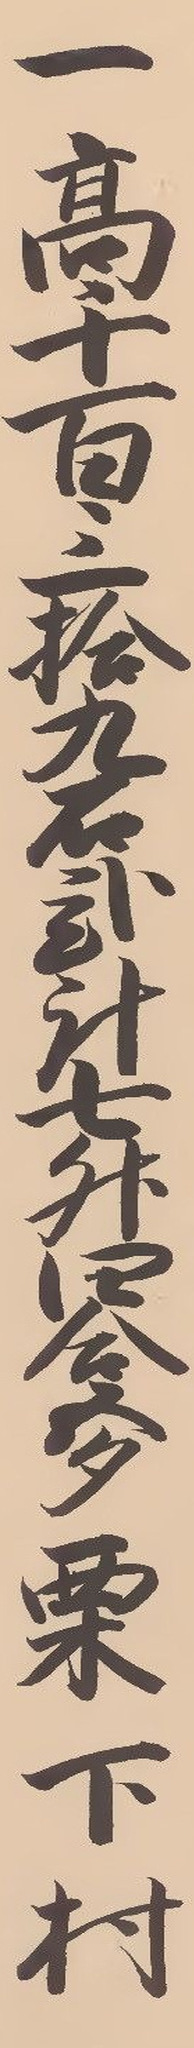一高千百三拾九石弐斗七升四合五勺栗下村
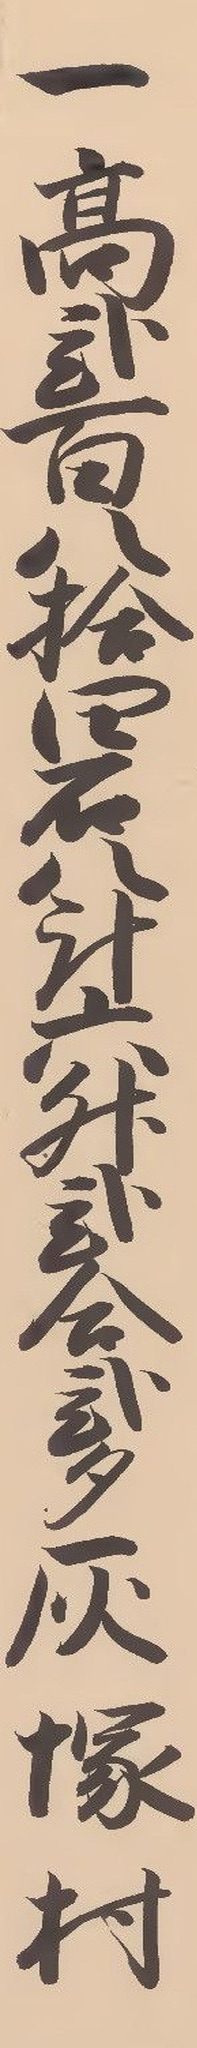一高弐百八拾四石八斗六升弐合弐勺灰塚村
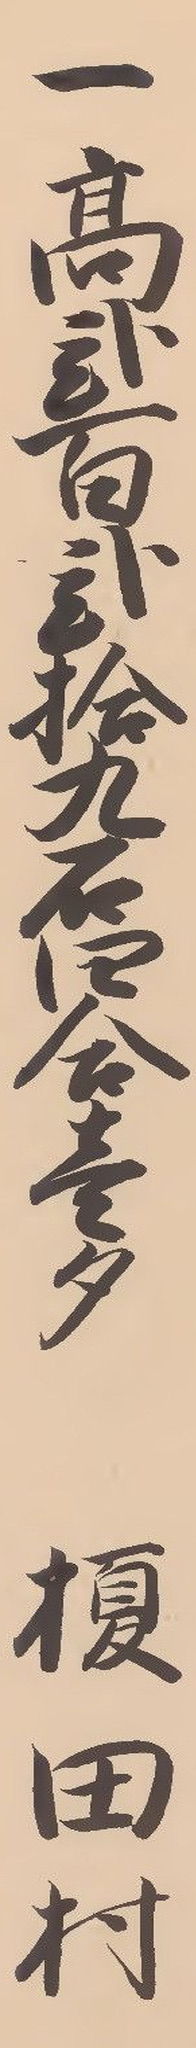一高弐百弐拾九石四合壱勺榎田村

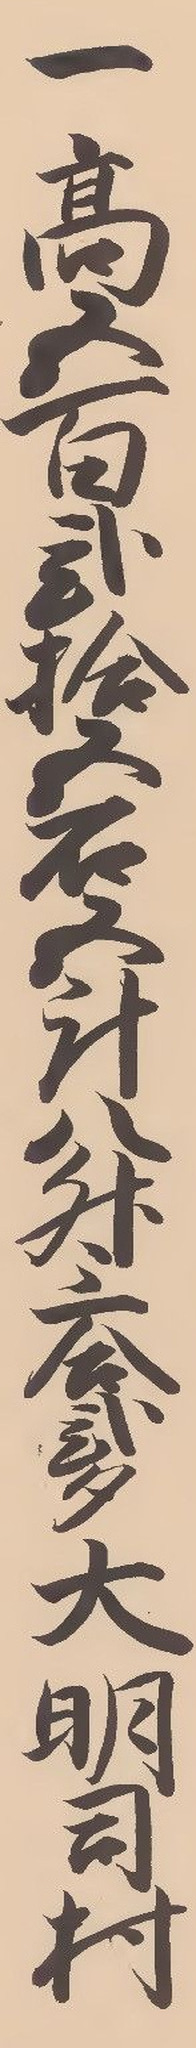一高五百弐拾五石五斗八升三合弐勺大明司村
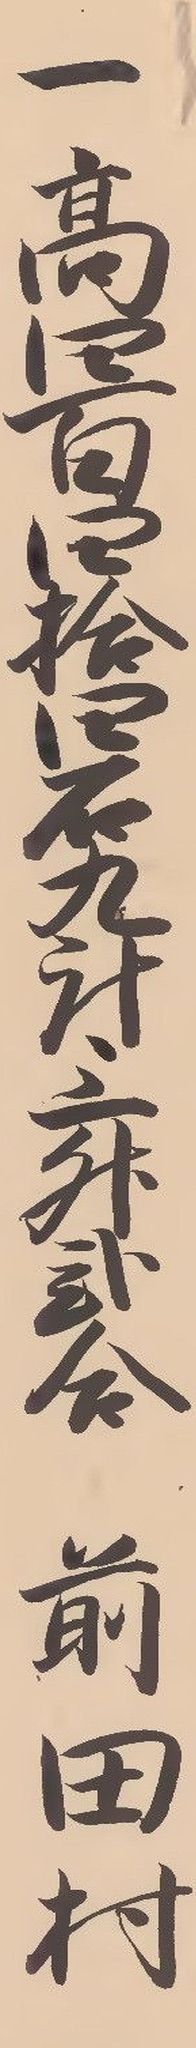一高四百四拾四石九斗三升弐合前田村
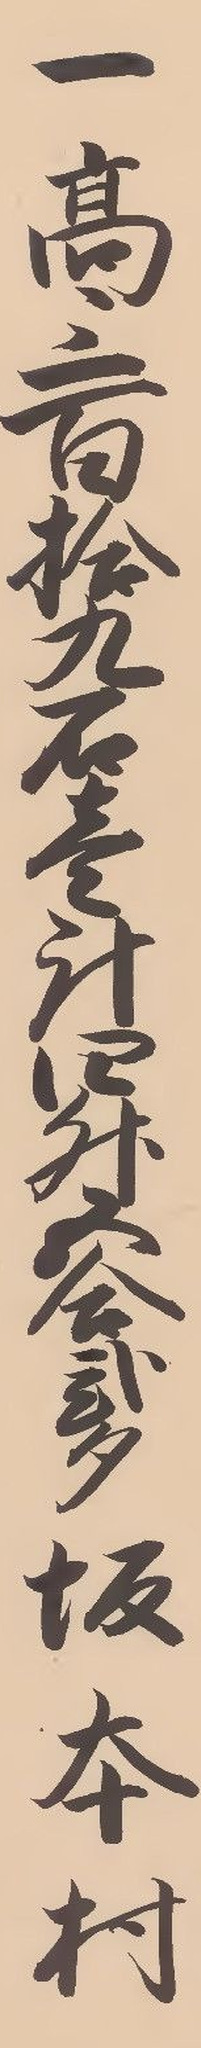一高三百拾九石壱斗四升五合弐勺坂本村
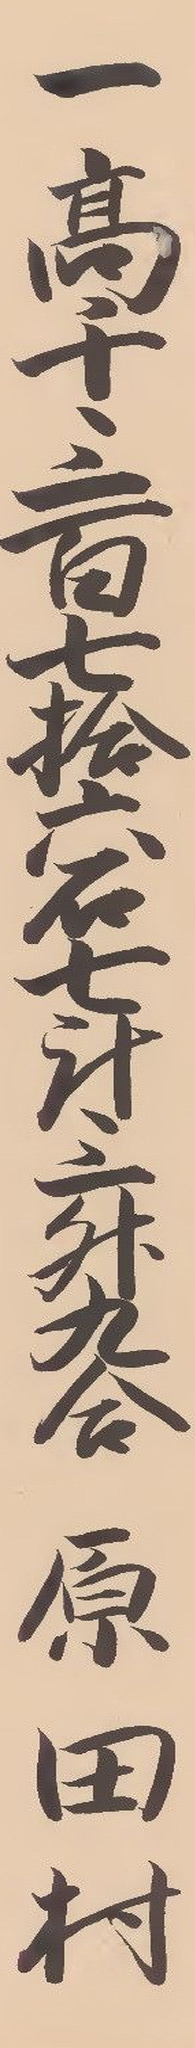一高千三百七拾六石七斗三升九合原田村
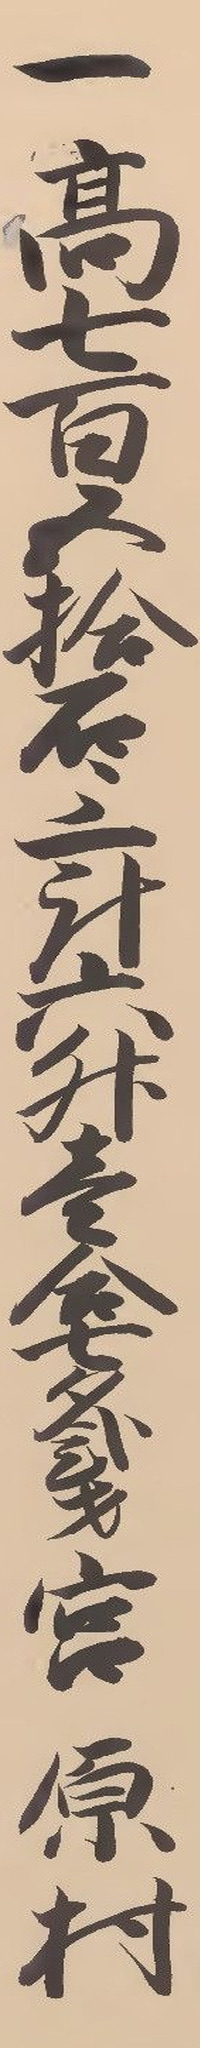一高七百五拾石三斗六升壱合七勺弐才宮原村
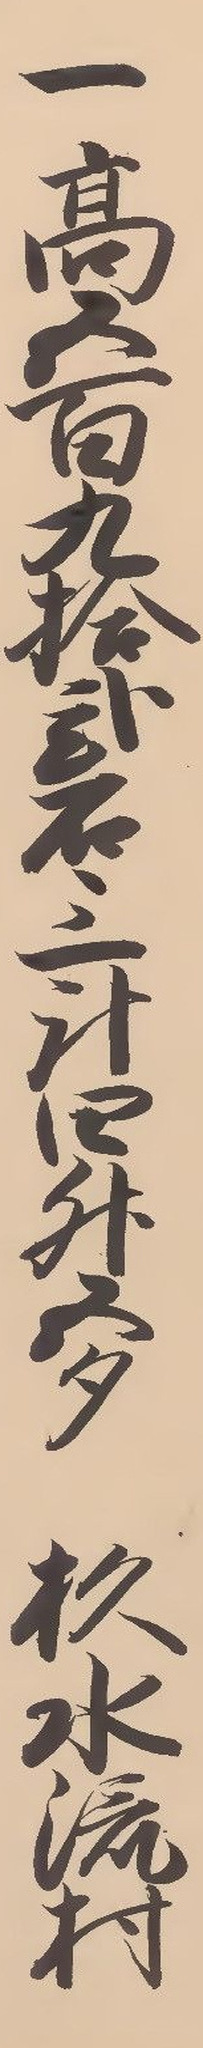一高五百九拾弐石三斗四升五勺杉水流村
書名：日向国郷帳
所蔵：国立公文書館 National Archives of Japan
